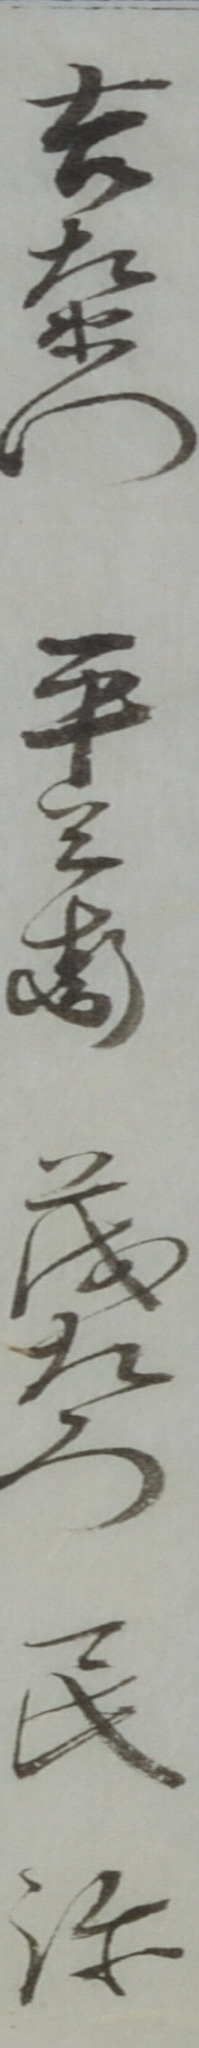吉左衛門平兵衛茂左衛門民弥
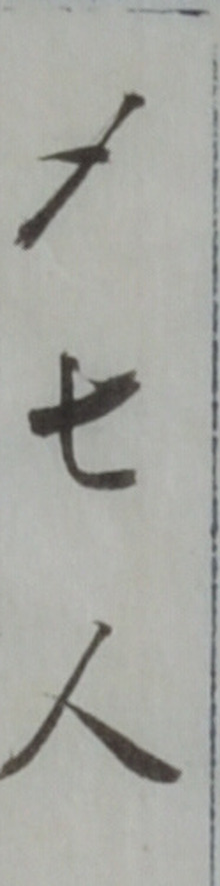〆七人
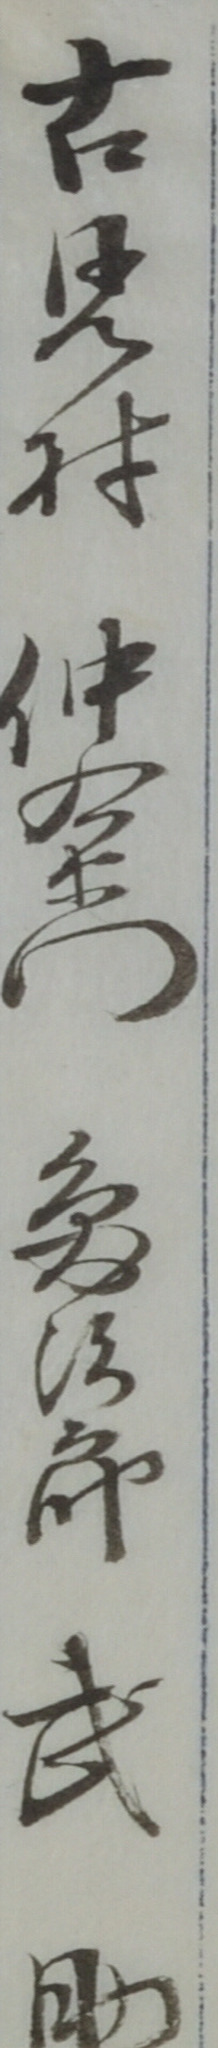古見村仲右衛門円治郎武助
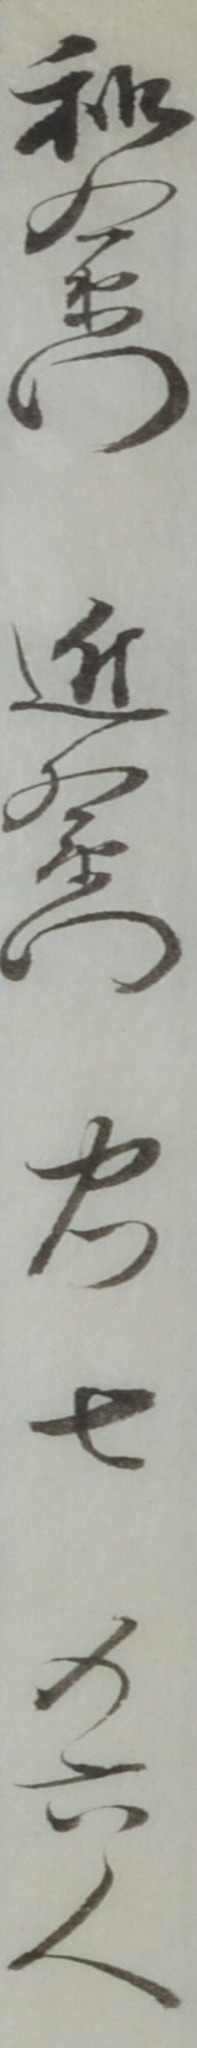和右衛門近右衛門忠七〆六人
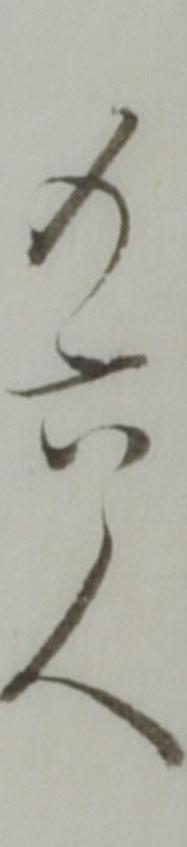〆七人

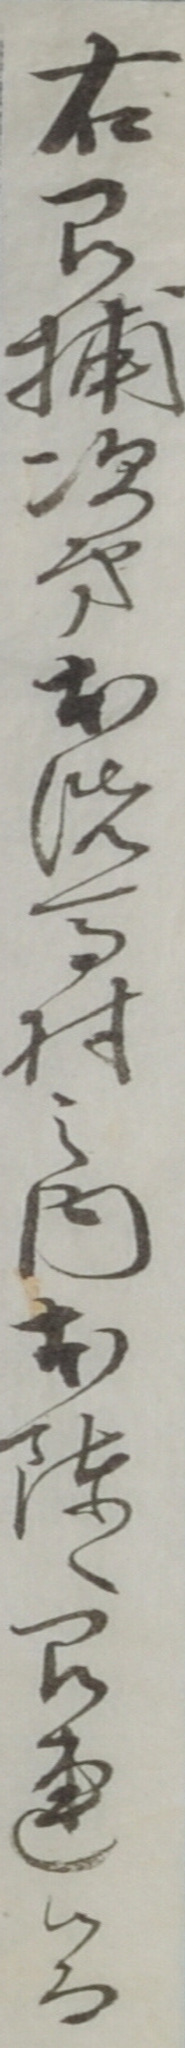右召捕次第本洗馬村之内本陣へ召連候而
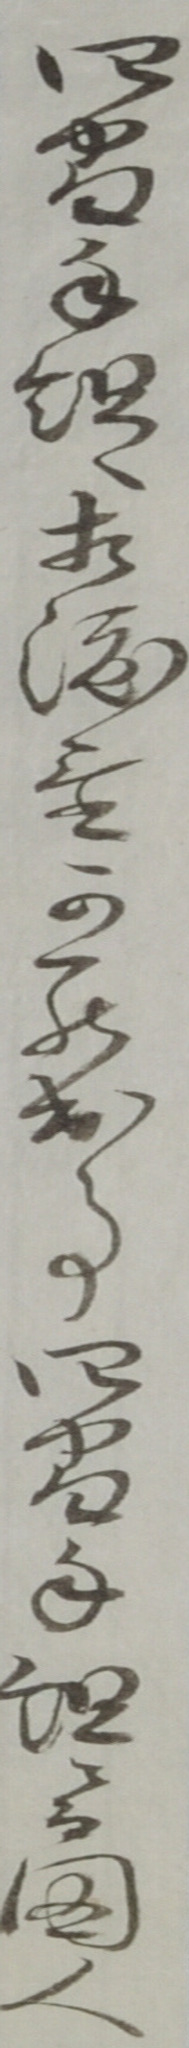四番手組へ相渡置可罷出事四番手組ニ而囚人
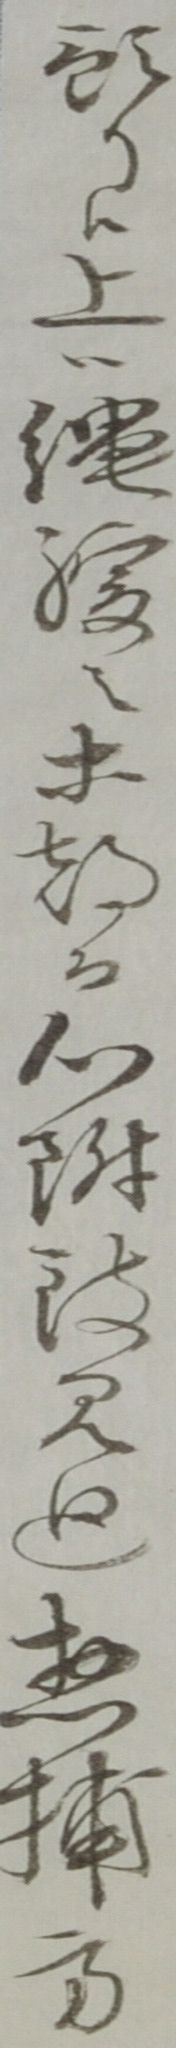預り候上ハ縄緩之等都而心附致見廻惣捕方
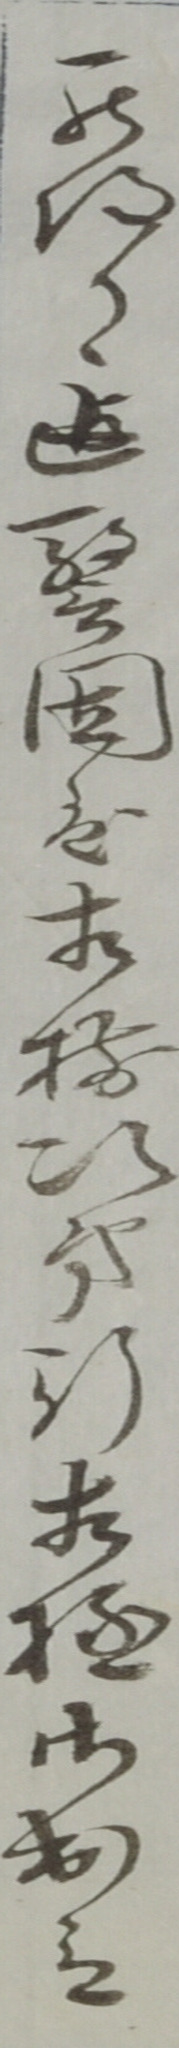罷帰り候迄警固致相揃次第行相極御出立
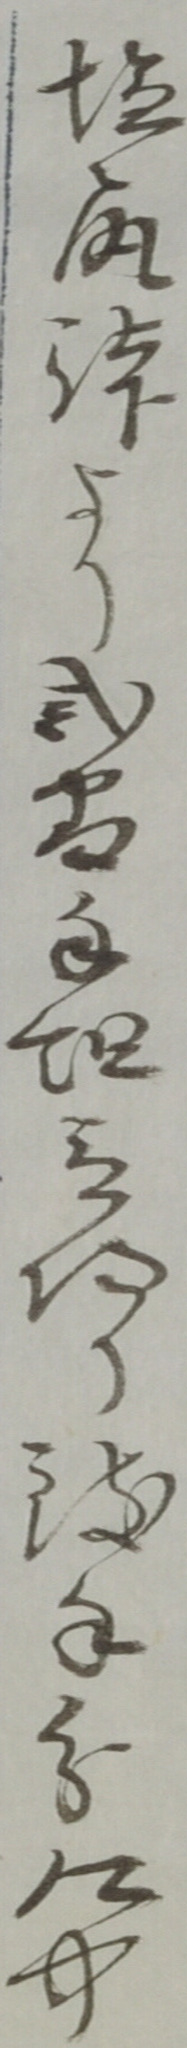塩尻峠より弐番手組立帰り致手分郷中
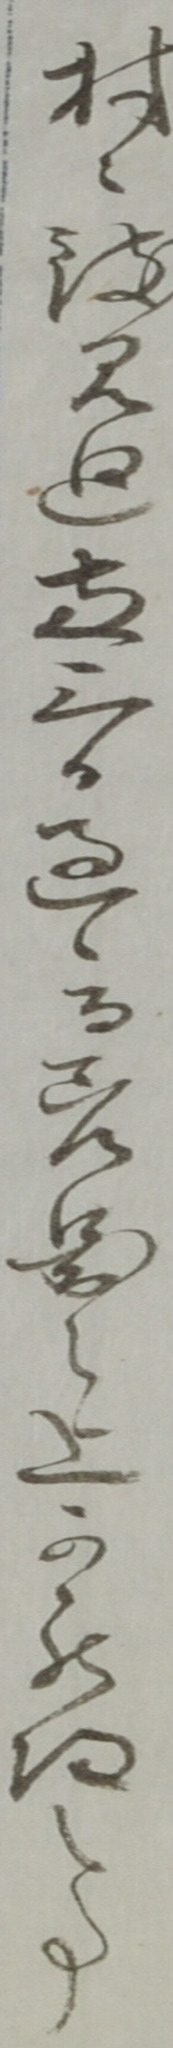村々致見廻両三日過候而差図之上可罷帰之事
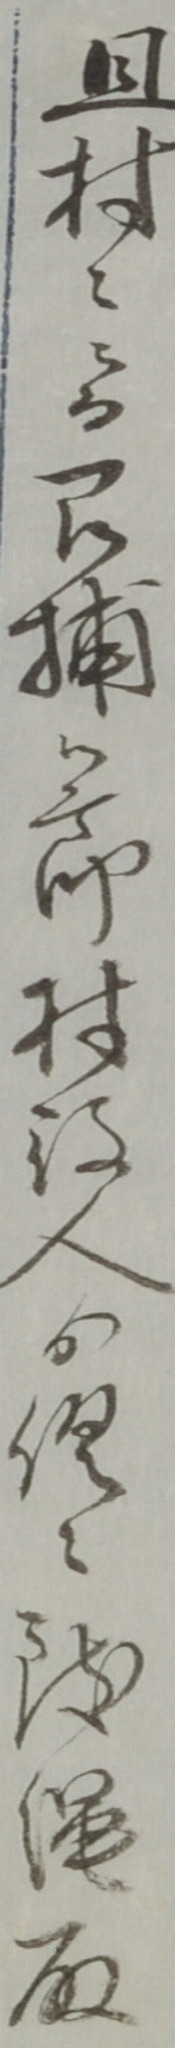且村々ニ而召捕候節村役人ゟ倶々致縄取
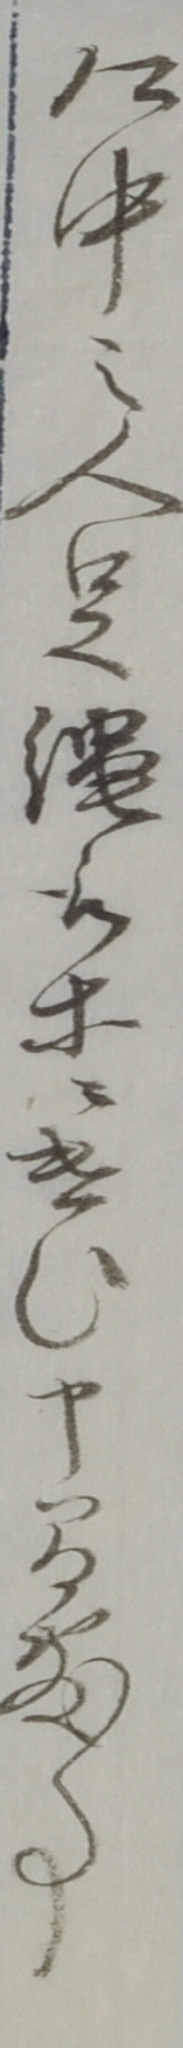郷中之人足縄取等ニ遣ひ申間敷事
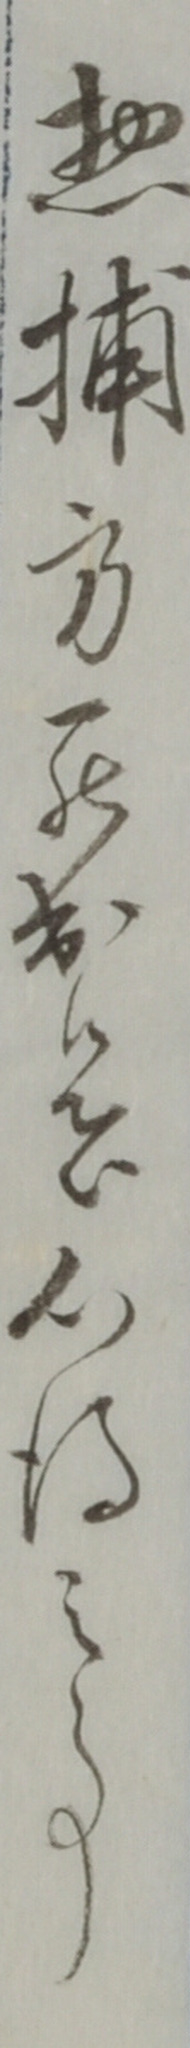惣捕方罷出候者心得之事
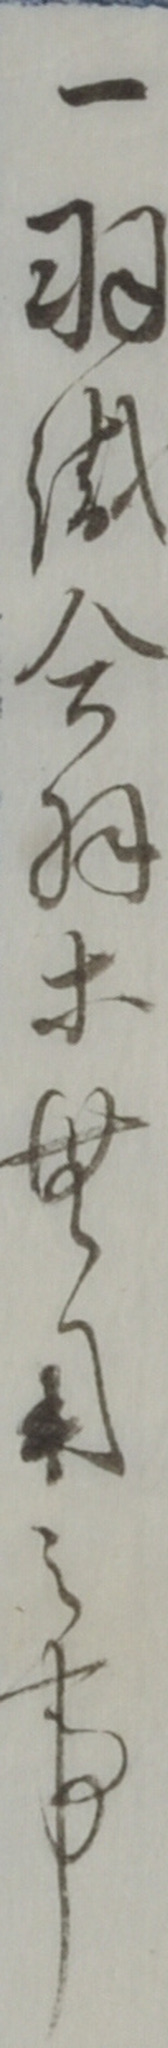一羽織合羽等無用之事
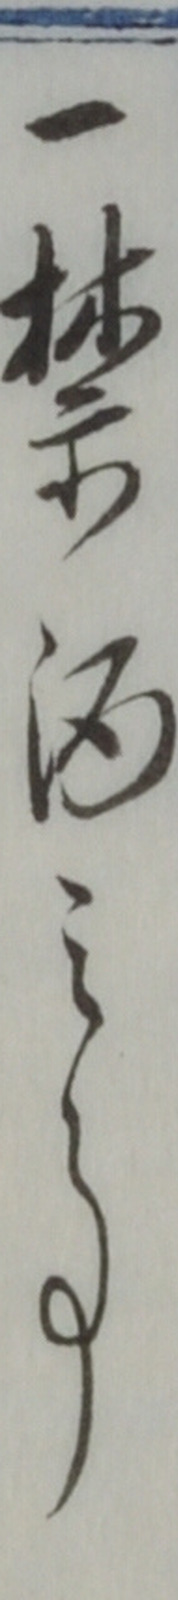一禁酒之事
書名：高遠領洗馬騒動一件抜書
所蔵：伊那市立高遠町図書館・合同会社AMANE
